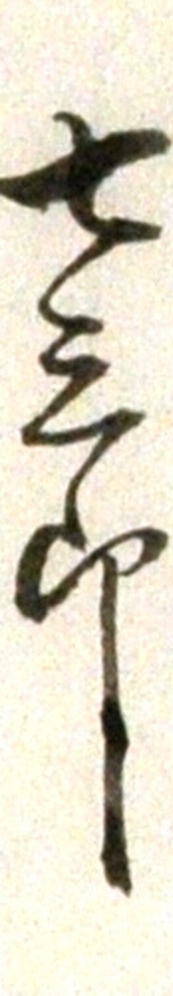七三郎
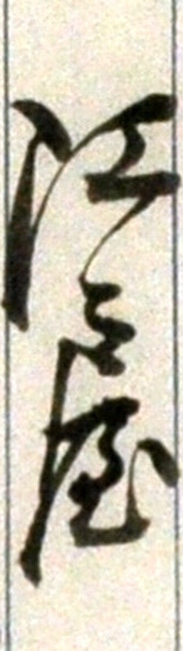江戸屋
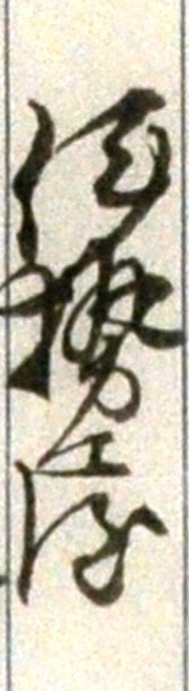伊勢屋
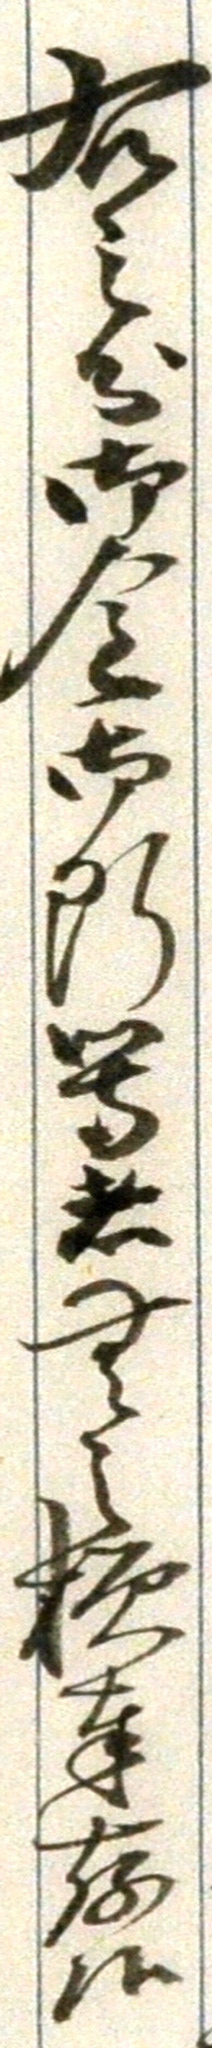右之分御金御改等者無之様奉存候
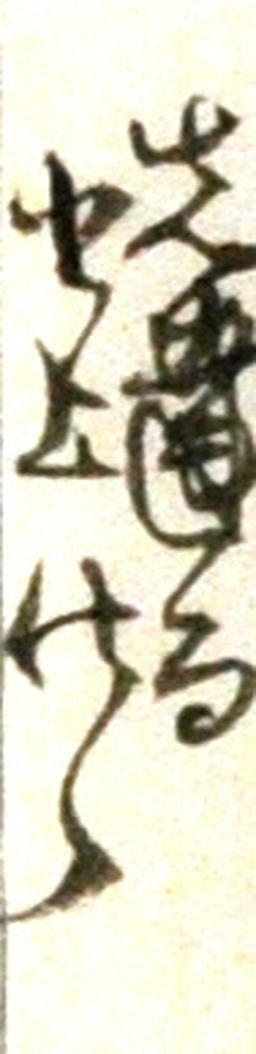書上仕候
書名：御拝地以来御用達相勤候者名前
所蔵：伊那市立高遠町図書館・合同会社AMANE
